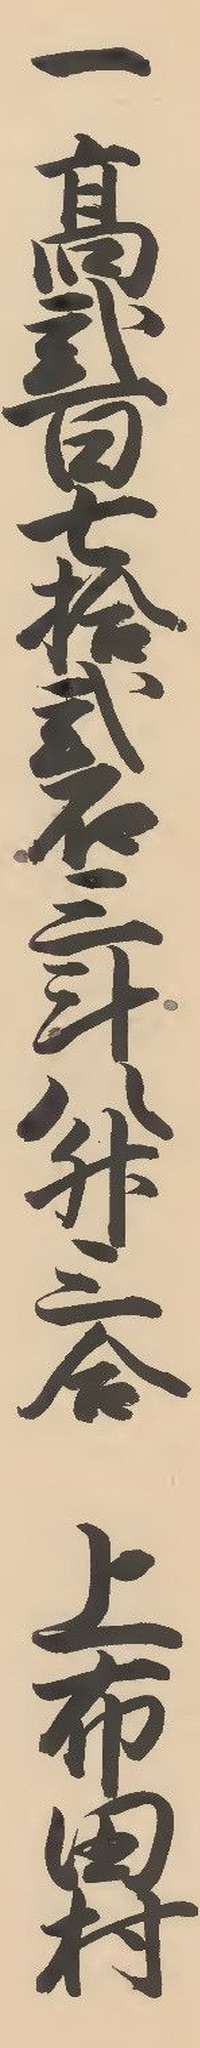一高弐百七拾弐石三斗八升三合上布田村
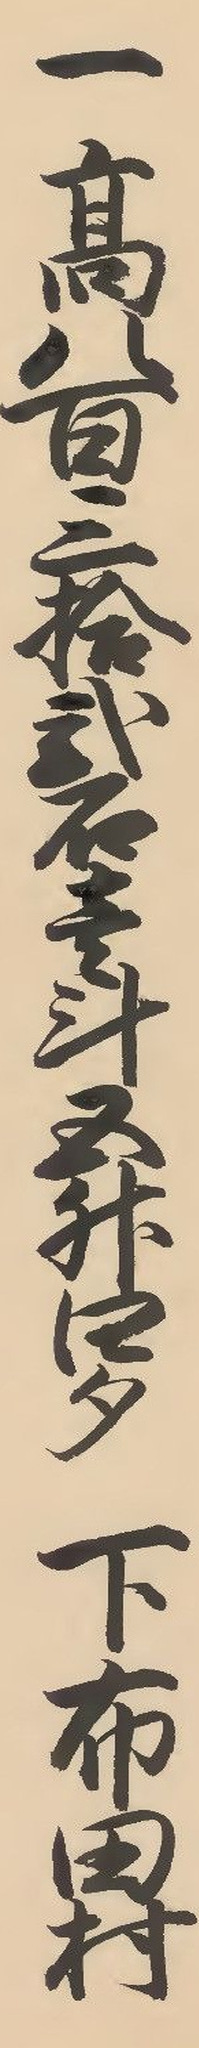一高八百三拾弐石壱斗五升四勺下布田村
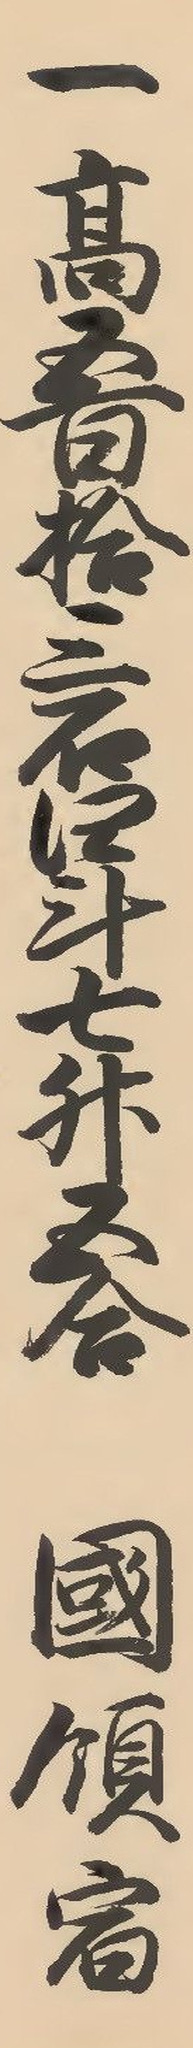一高五百拾三石四斗七升五合国領宿
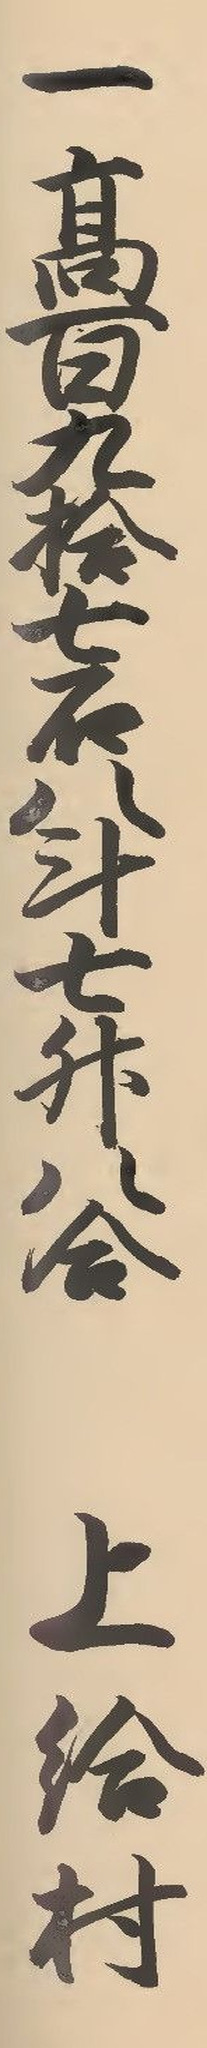一高百九拾七石八斗七升八合上給村
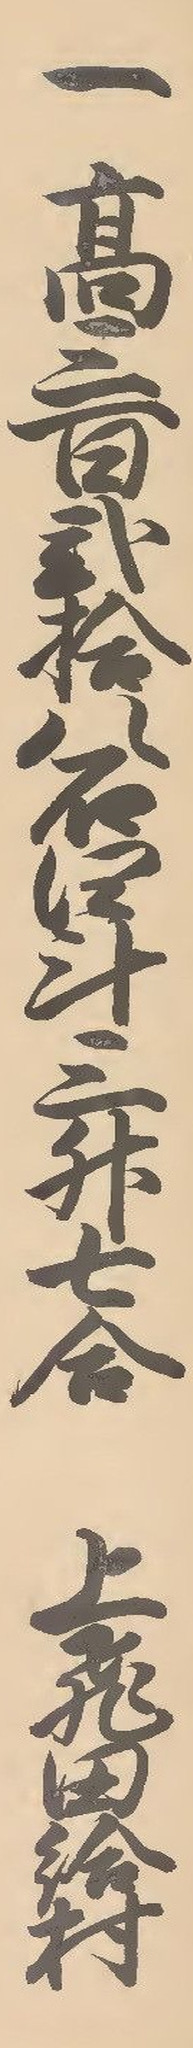一高三百弐拾八石四斗三升七合上飛田給村
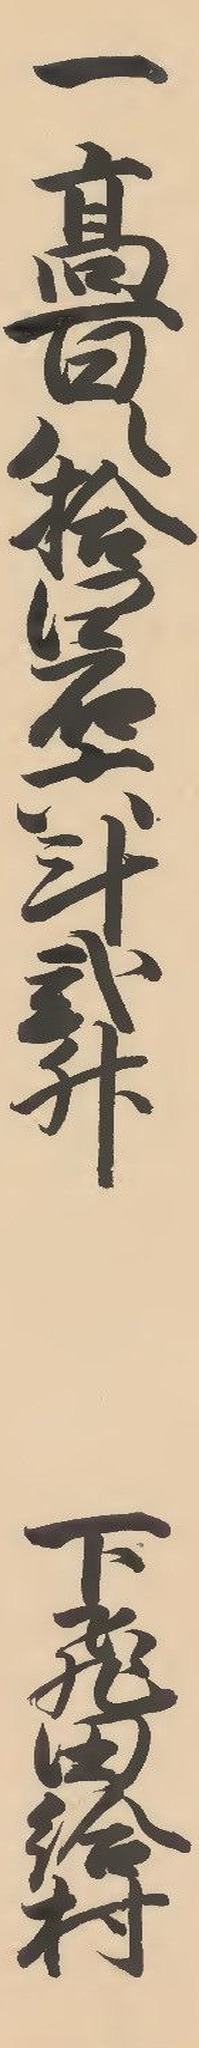一高百八拾四石六斗弐升下飛田給村
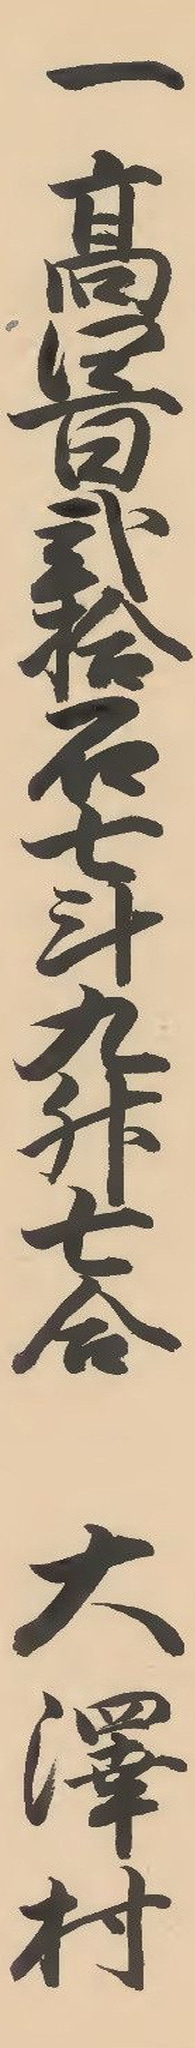一高四百弐拾石七斗九升七合大澤村
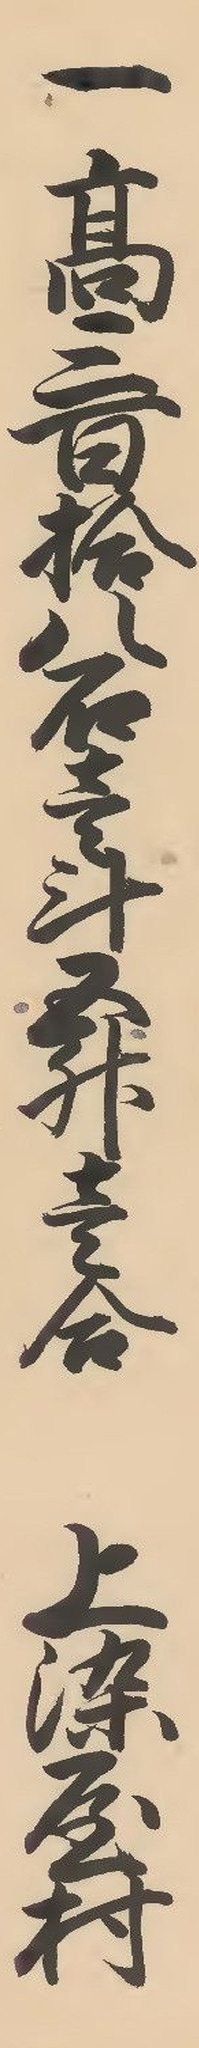一高三百拾八石壱斗五升壱合上染屋村

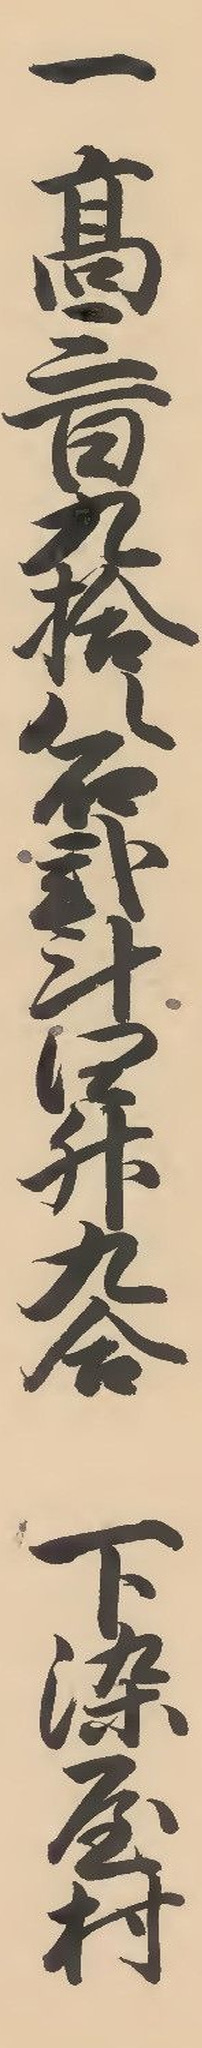一高三百九拾八石弐斗四升九合下染屋村
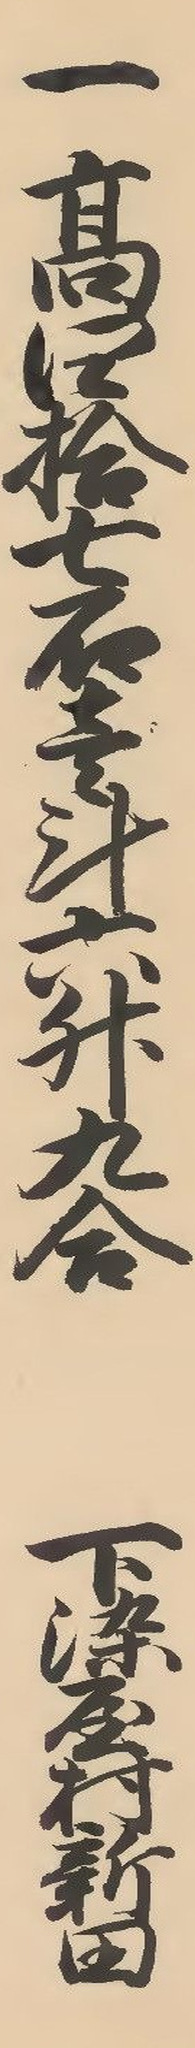一高四拾七石壱斗六升九合下染屋村新田
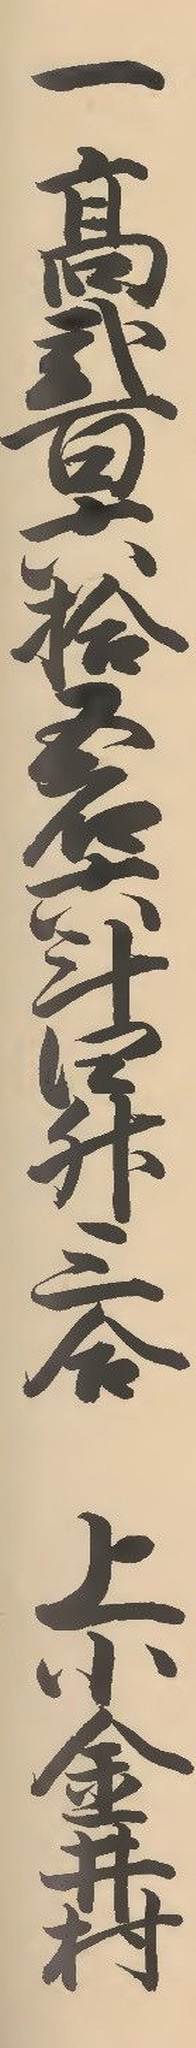一高弐百六拾五石六斗四升三合上小金井村
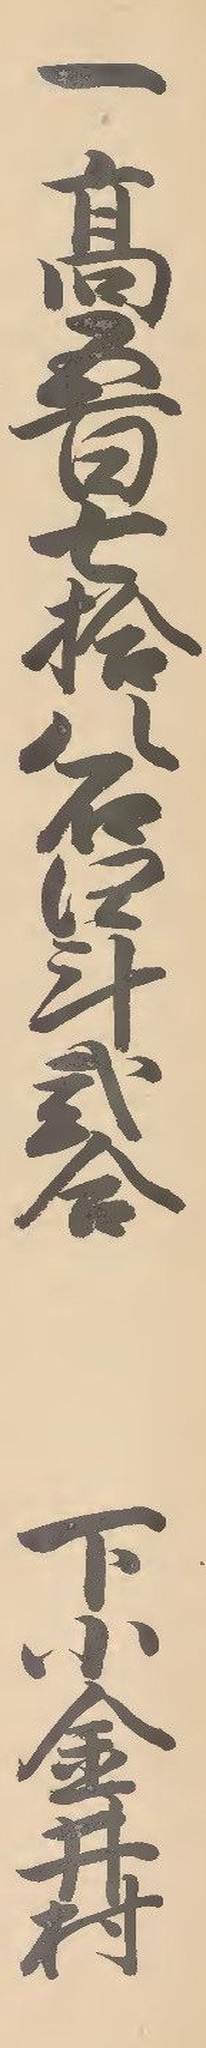一高五百七拾八石四斗弐合下小金井村
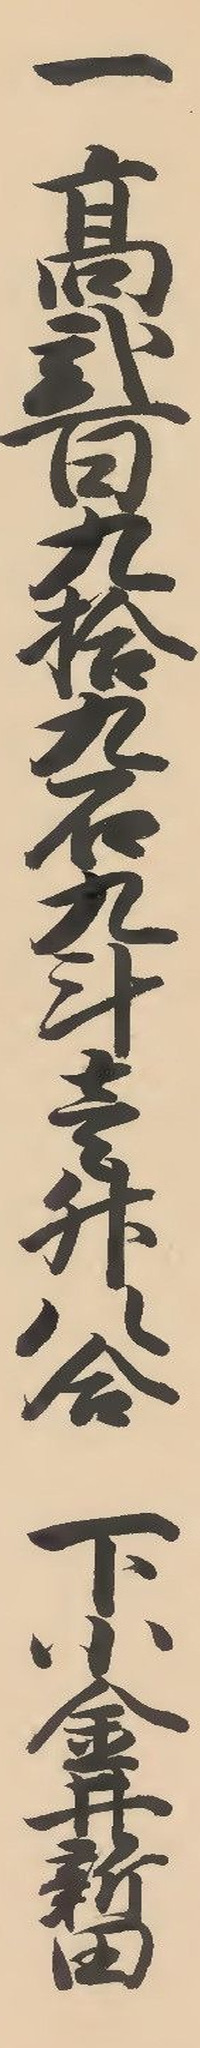一高弐百九拾九石九斗壱升八合下小金井新田
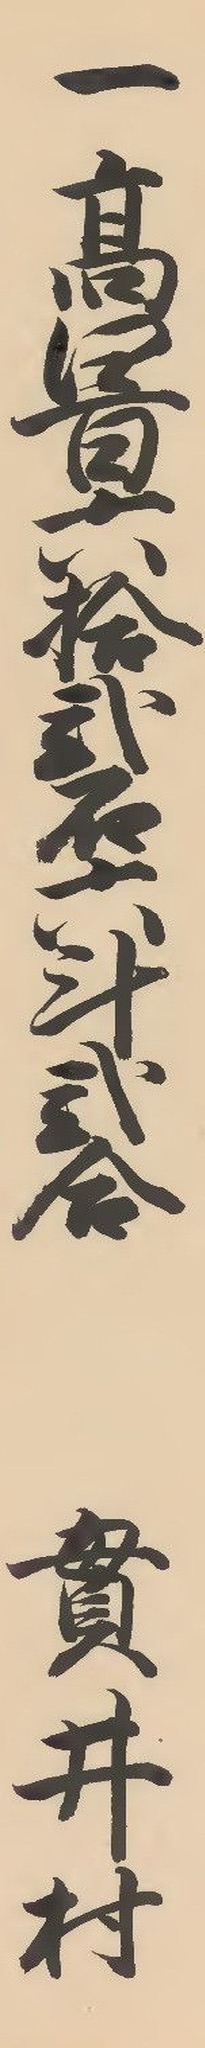一高四百六拾弐石六斗弐合貫井村
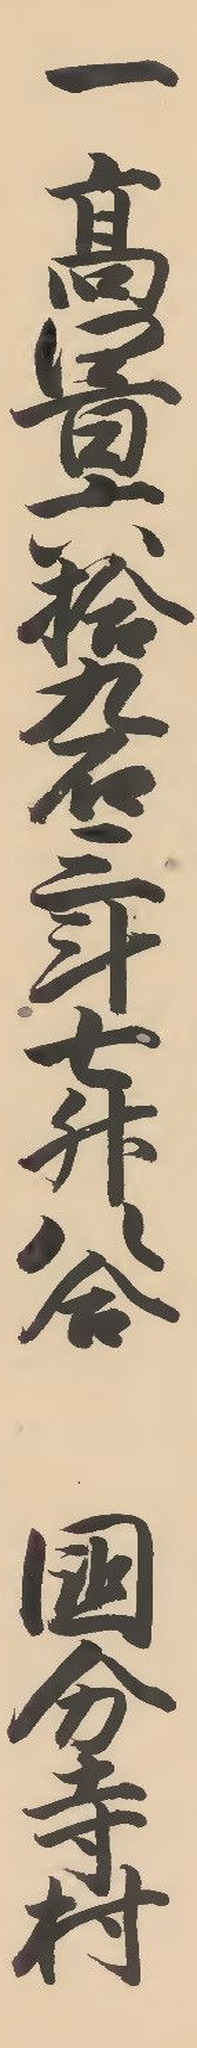一高四百六拾九石三斗七升八合国分寺村

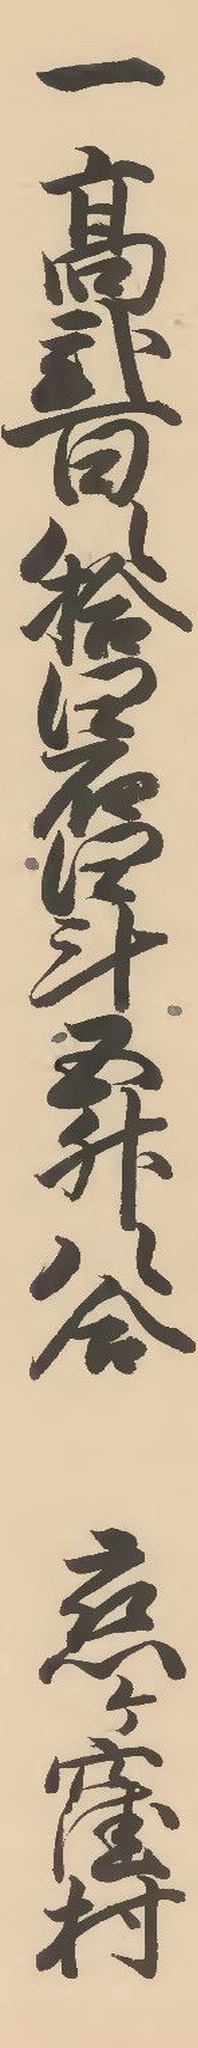一高弐百八拾四石四斗五升八合恋ヶ窪村
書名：武蔵国郷帳　上
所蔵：国立公文書館 National Archives of Japan
